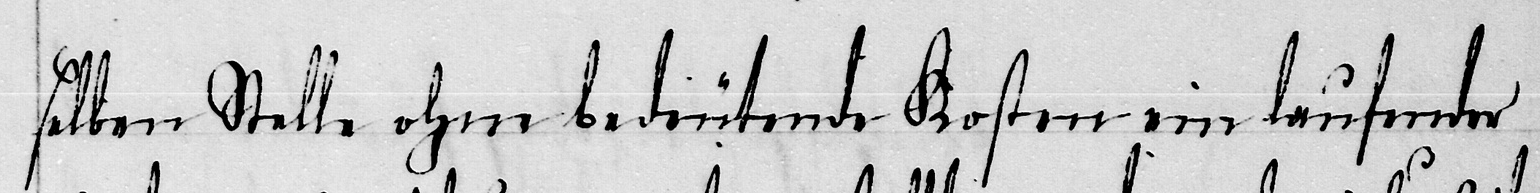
selben Stelle ohne bedeutende Kosten ein laufender
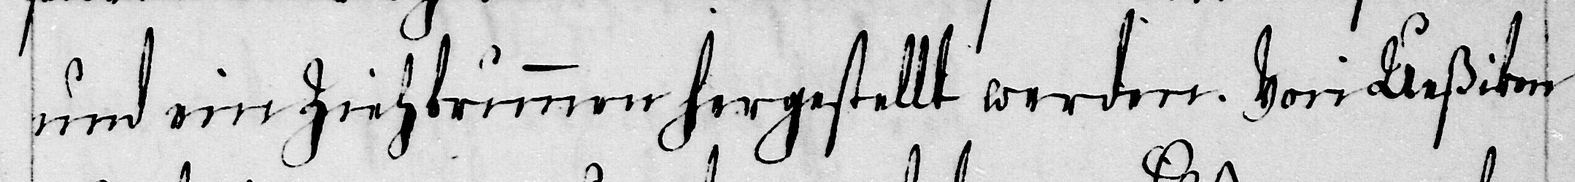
und ein Ziehbrunnen hergestellt werden. Von Ueßikon
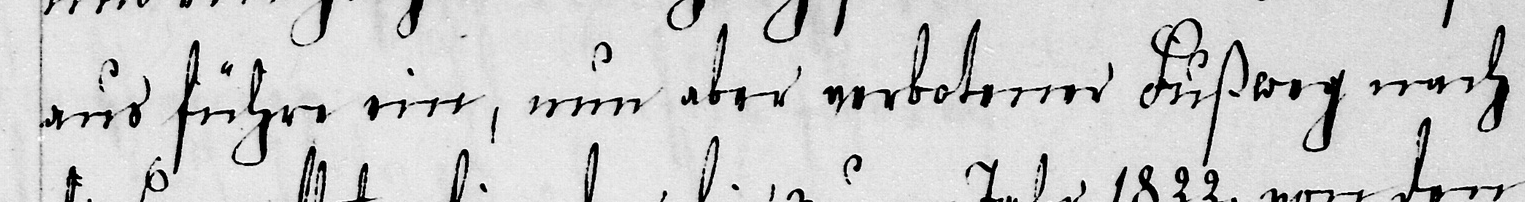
aus führe ein, nun aber verbotener Fußweg nach
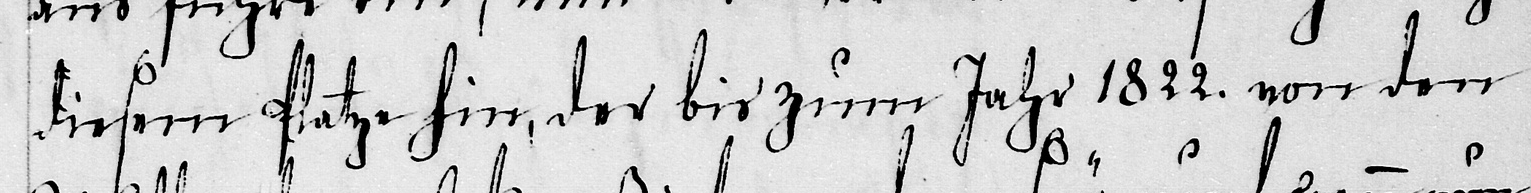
diesem Platze hin, der bis zum Jahr 1822. von den
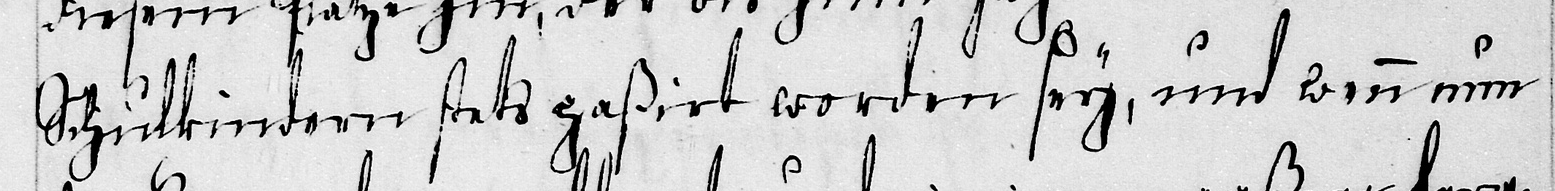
Schulkindern stets paßirt worden sey, und wenn nun
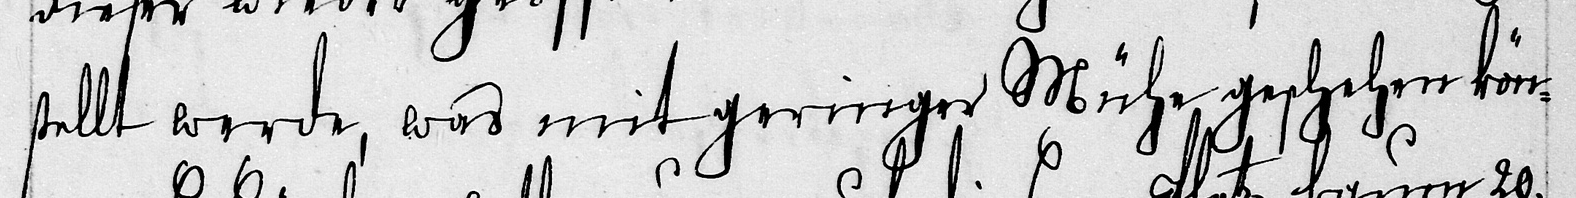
tellt werde, was mit geringer Mühe geschehen kön¬
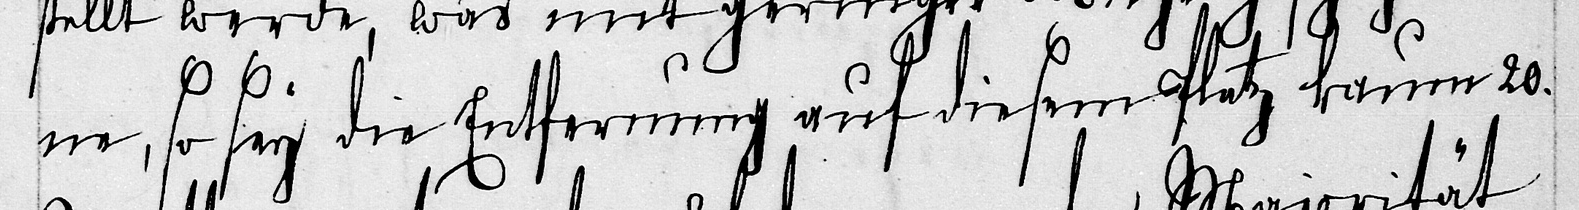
ne, so sey die Entfernung auf diesem Platz kaum 20.
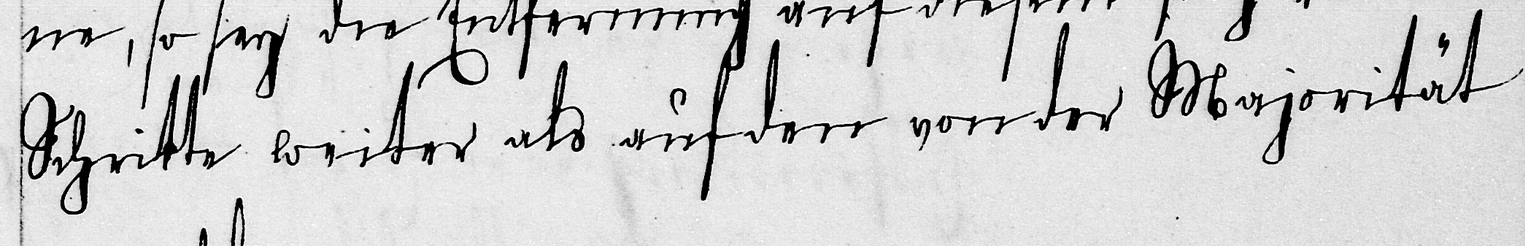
Schritte weiter als auf den von der Majorität
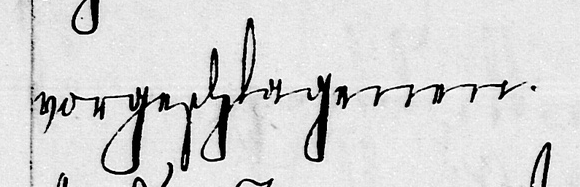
vorgeschlagenen.
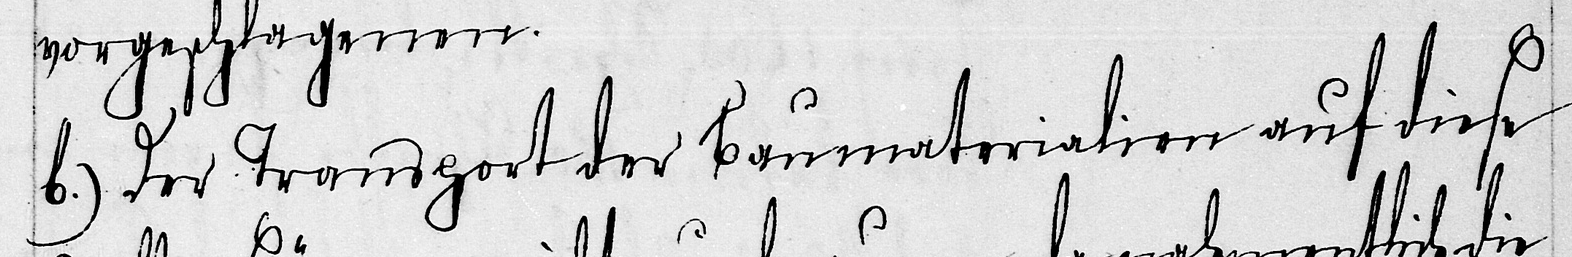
b.) Der Transport der Baumaterialien auf diese
